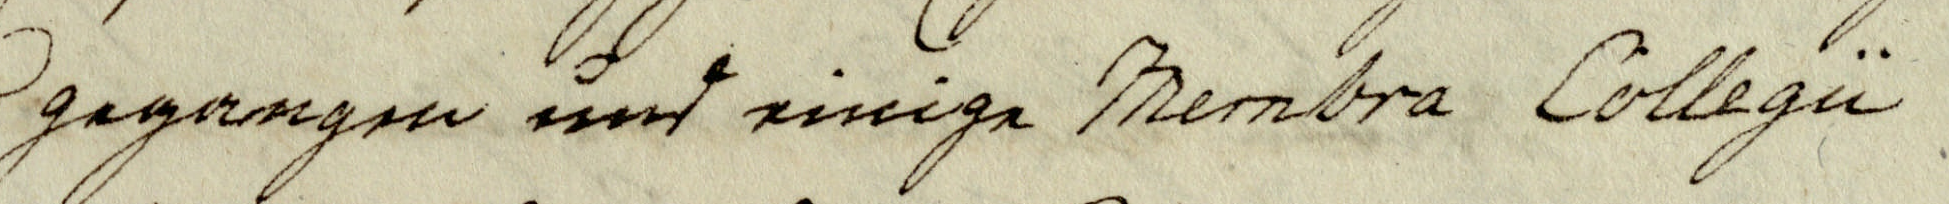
gegangen und einige Membra Collegii
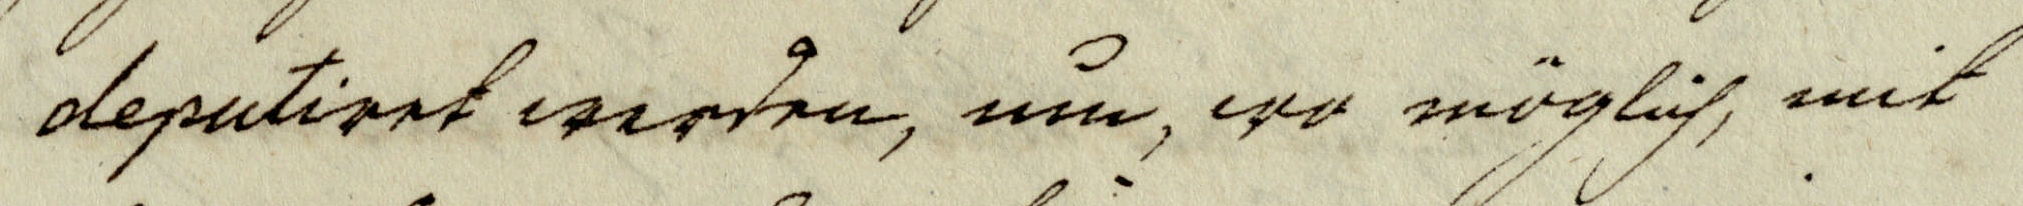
deputiert werden, um, wo möglich, mit
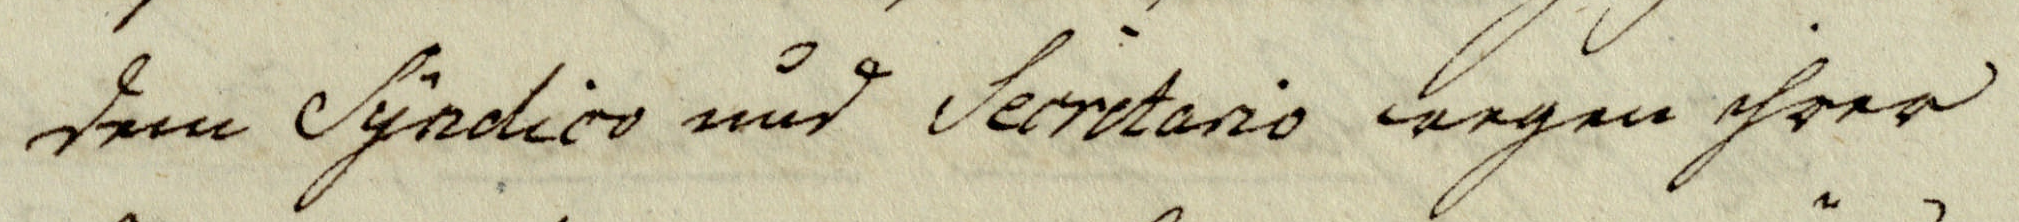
dem Sÿndico und Secretario wegen ihrer
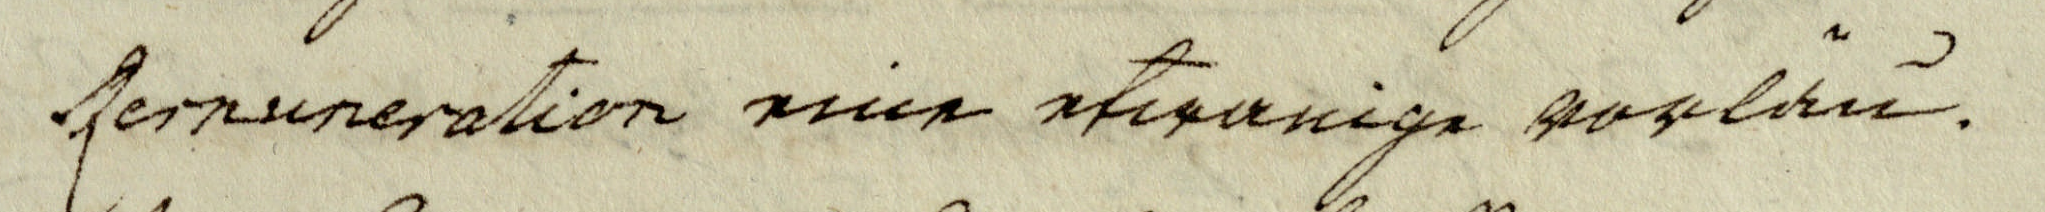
Remuneration eine etwanige vorläu¬
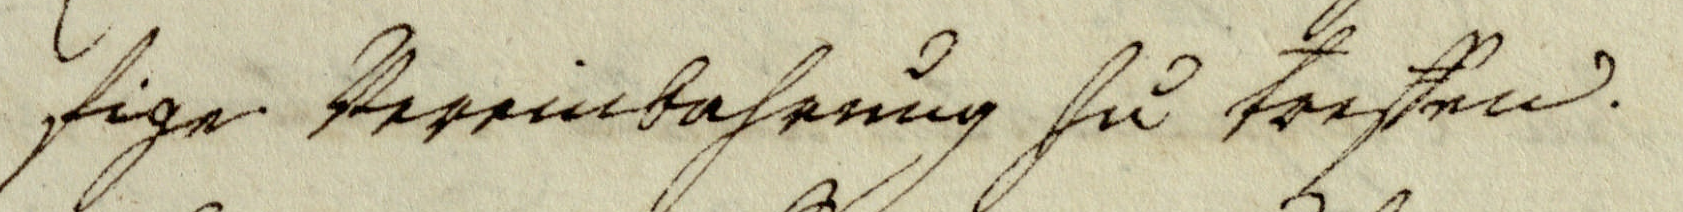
fige Vereinbahrung zu treffen.
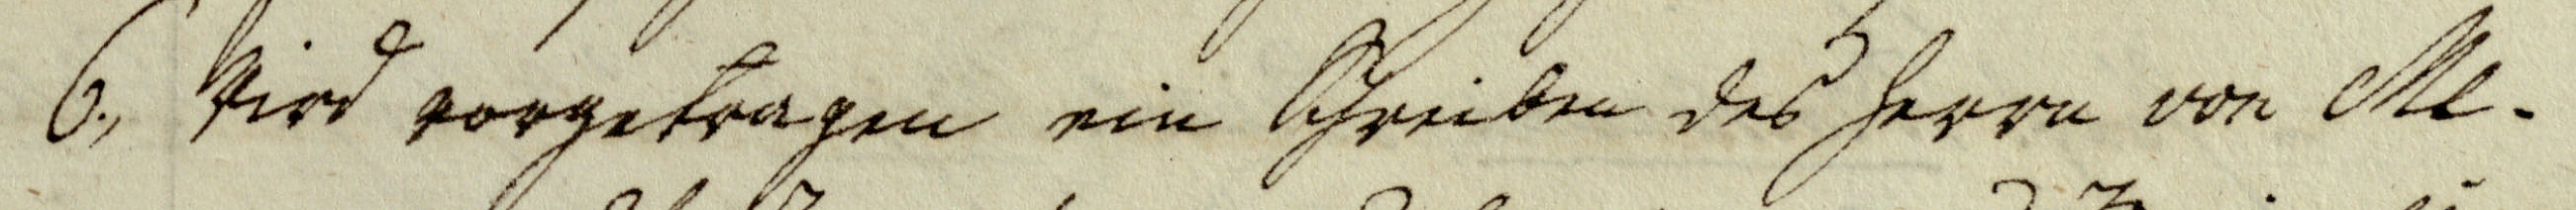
6., Wird vorgetragen ein Schreiben des Herrn von Me¬
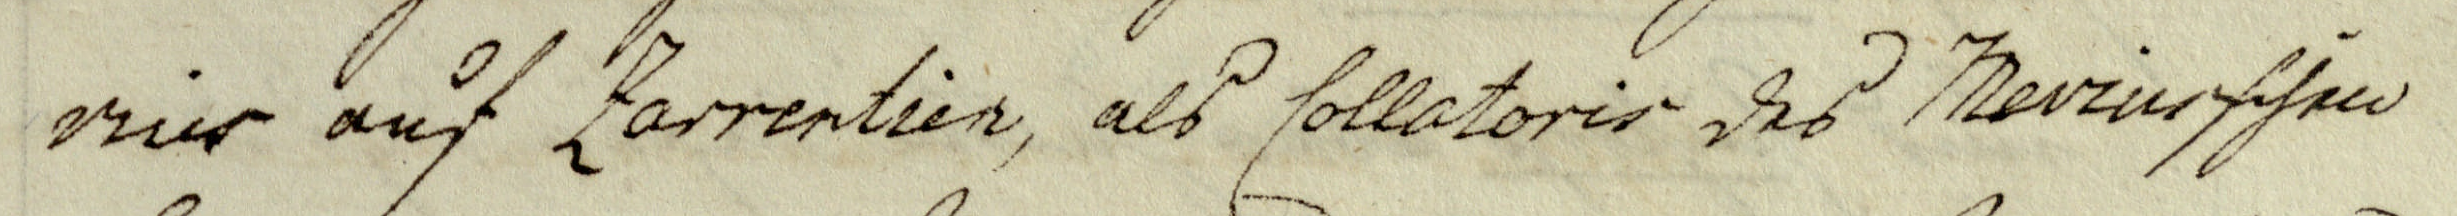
rius auf Zarrentien, als Collatoris des Meriusschen
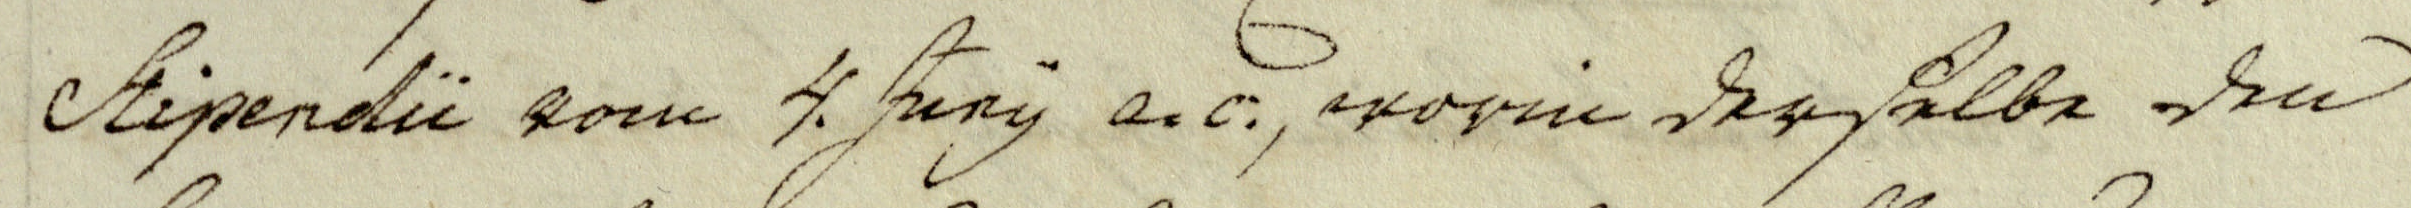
Stipendii vom 4. Junÿ a.c., worin derselbe den
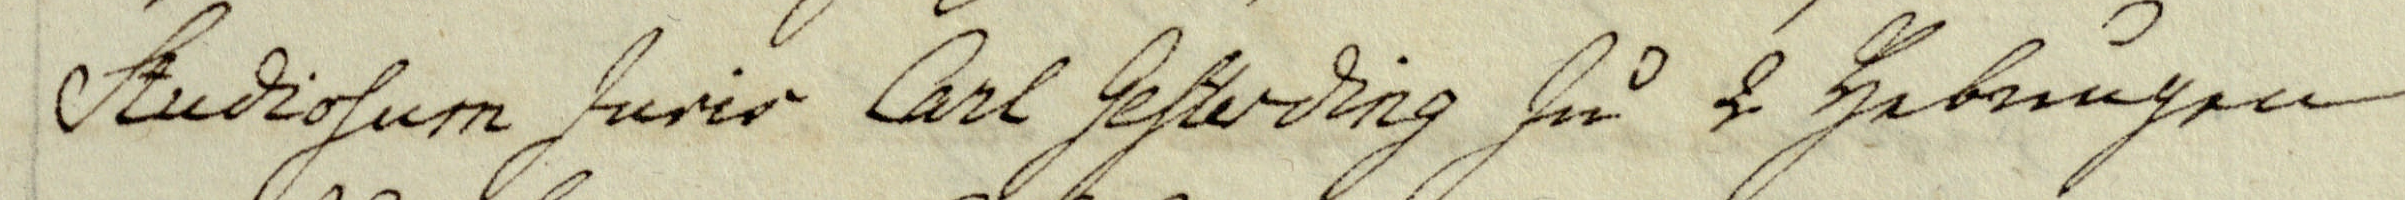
Studiosum Juris Carl Gesterding zu 2. Hebungen
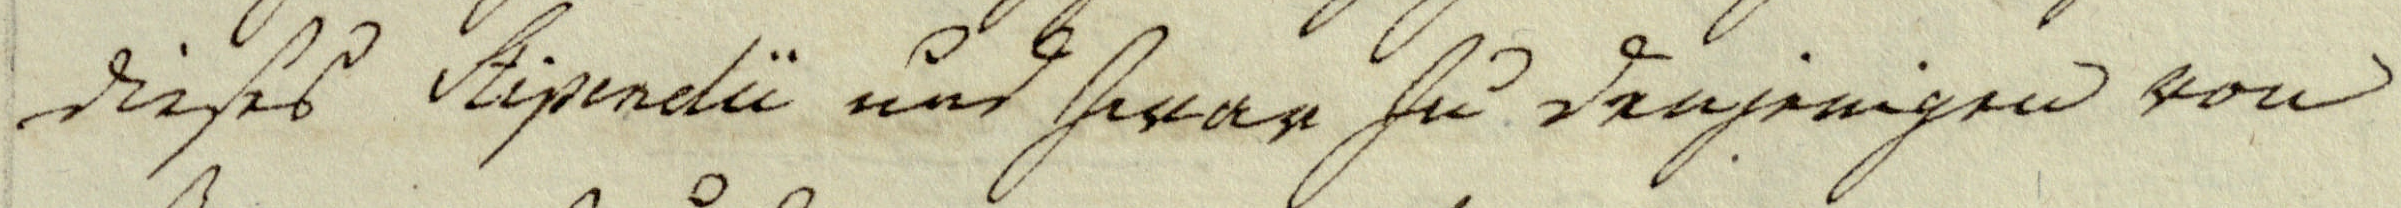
dieses Stipendii und zwar zu denjenigen von
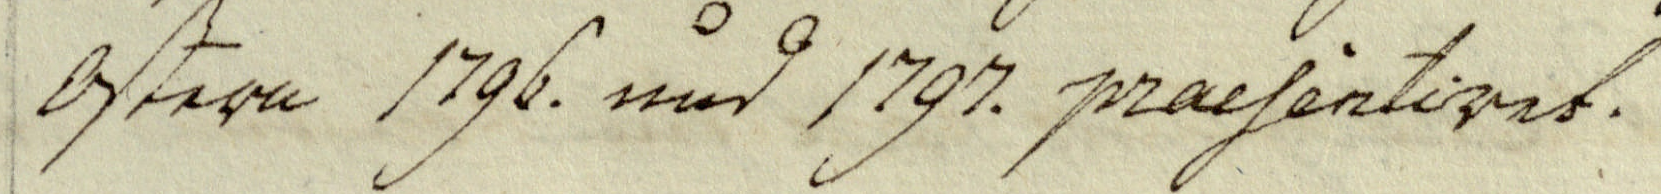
Ostern 1796. und 1797 praesentiert.
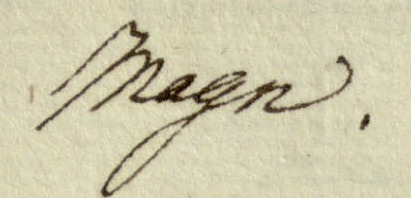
Magn.
